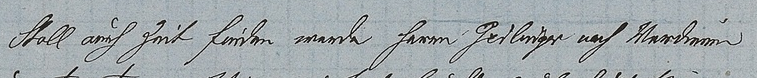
Stoll auch Zeit finden werde Herrn Geilinger nach Verdienen
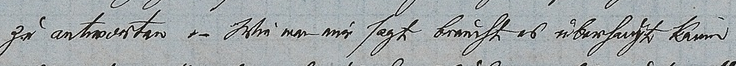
zu antworten. – Wie man mir sagt braucht es überhaupt keine
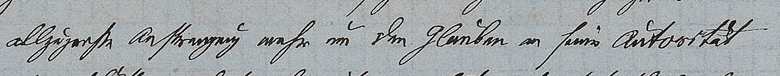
allzugroße Anstrengung mehr um den Glauben an seine Autorität
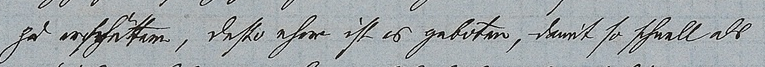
zu erschüttern, desto eher ist es geboten, damit so schnell als
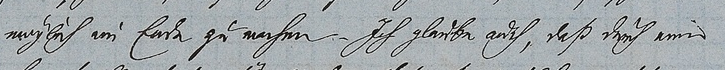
möglich ein Ende zu machen. – Ich glaube auch, daß durch eine
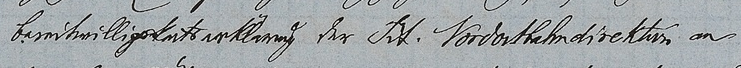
Bereitwilligkeitserklärung der Tit. Nordostbahndirektion an
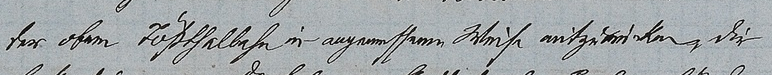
der obern Tößthalbahn in angemessener Weise mitzuwirken, die
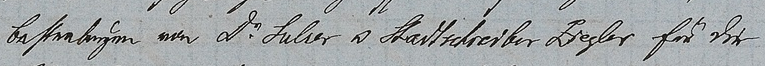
Bestrebungen von DrSulser & Stadtschreiber Ziegler für die
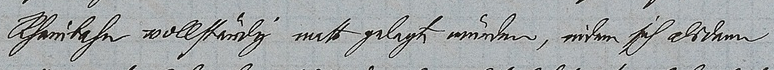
Rheinbahn vollständig matt gelegt würden, indem sich alsdann
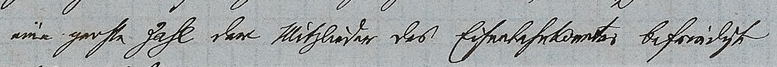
eine große Zahl der Mitglieder des Eisenbahnkomites befriedigt
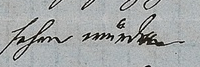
sehen würde.
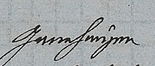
Genehmigen
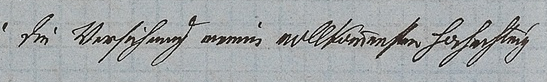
die Versicherung meiner vollkommensten Hochachtung
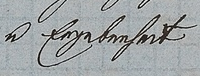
& Ergebenheit
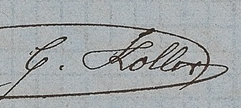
G. Koller
